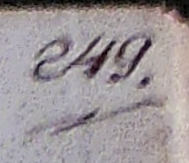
249.
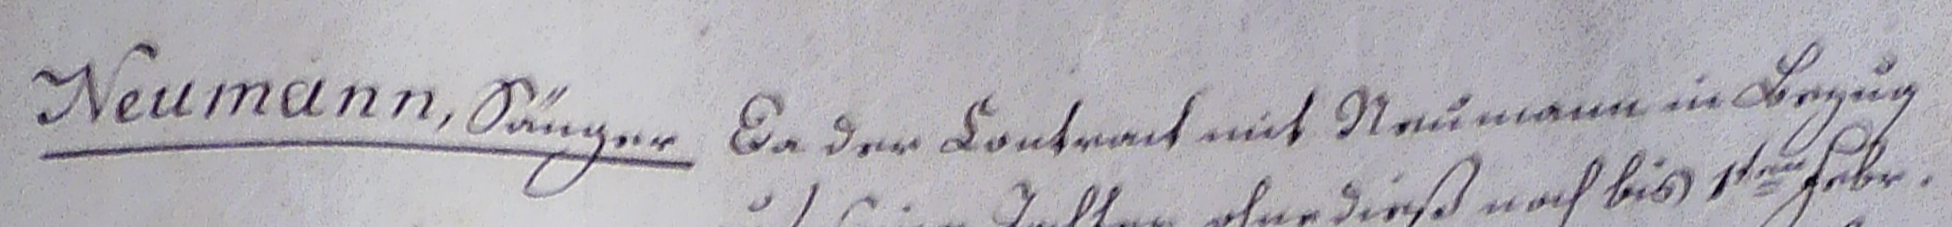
Neumann, Sänger Da der Contract mit Neumann in Bezug
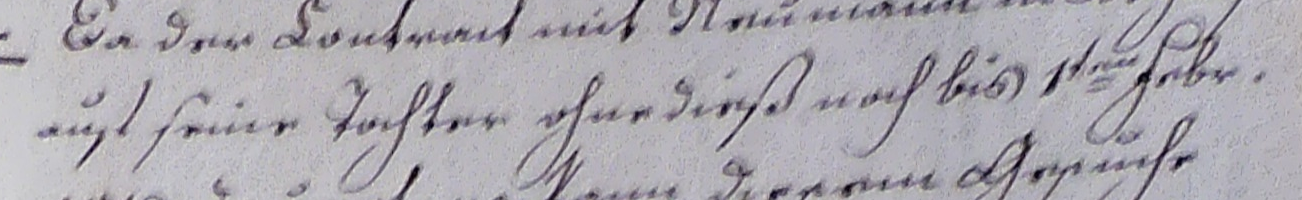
auf seine Tochter ohnedieß noch bis 1ste͇n Febr.
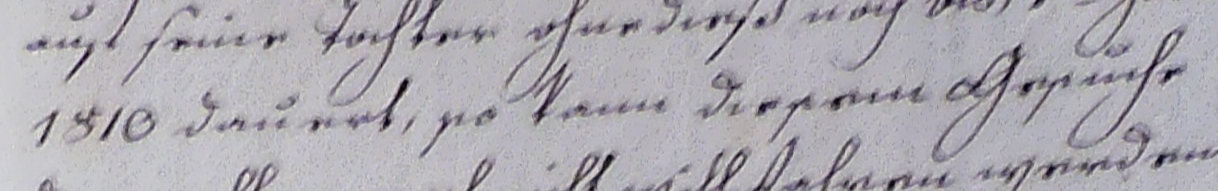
1810 dauert, so kann diesem Gesuche
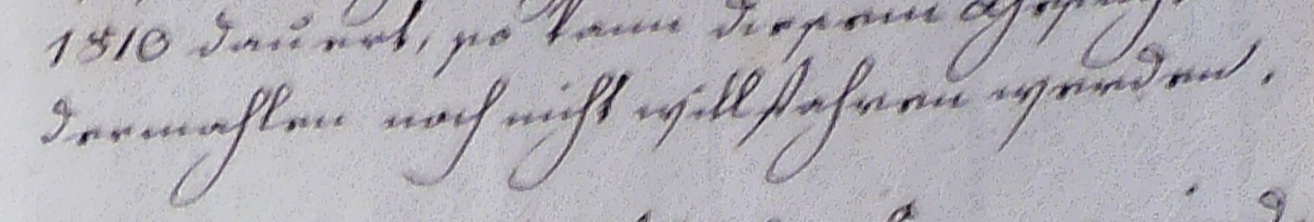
dermahlen noch nicht willfahren werden.
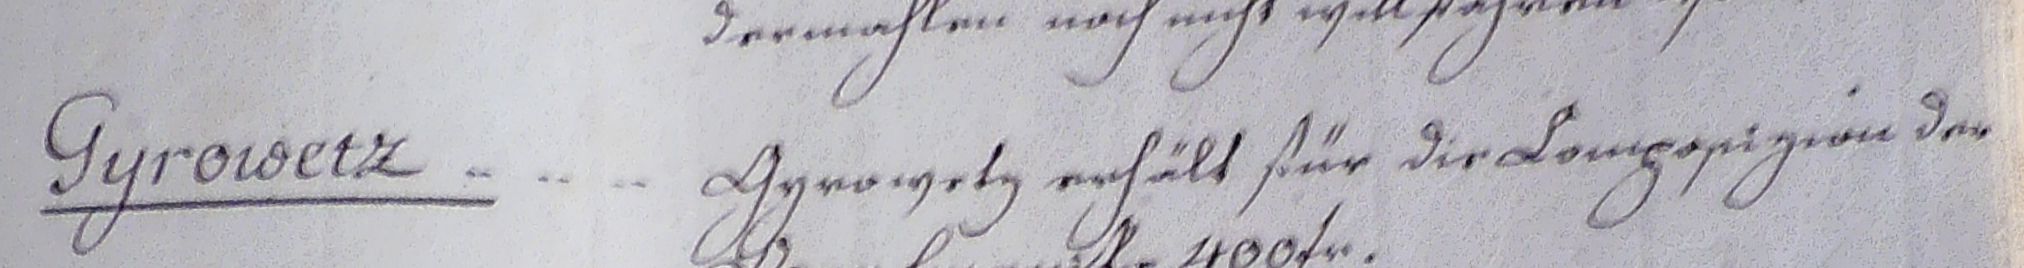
Gyrowetz .. .. .. Gyrowetz erhält für die Composizion der
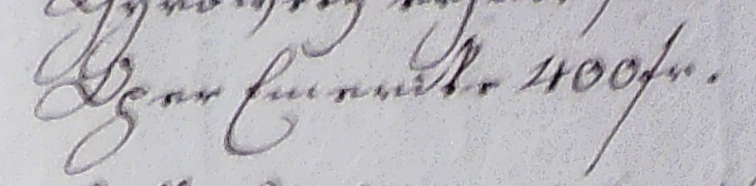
Oper Emerike 400fr.
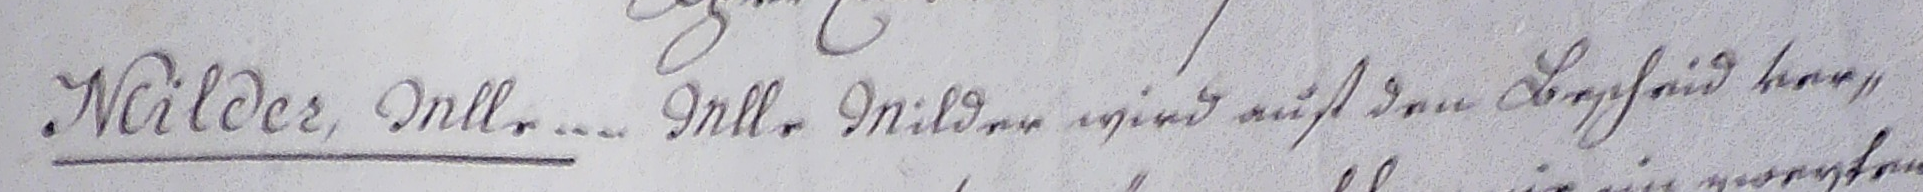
Milder, Mlle .. .. Mlle Milder wird auf den Bescheid ver¬
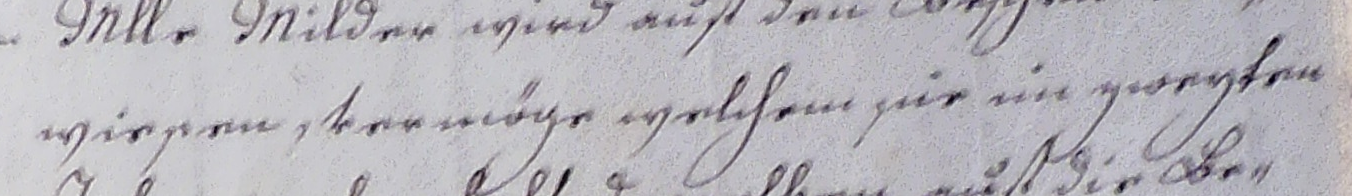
wiesen, vermöge welchem sie im zweyten
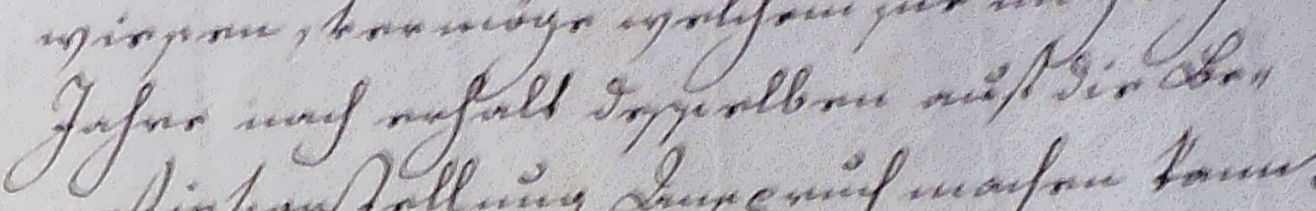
Jahre nach erhalt desselben auf die Be¬
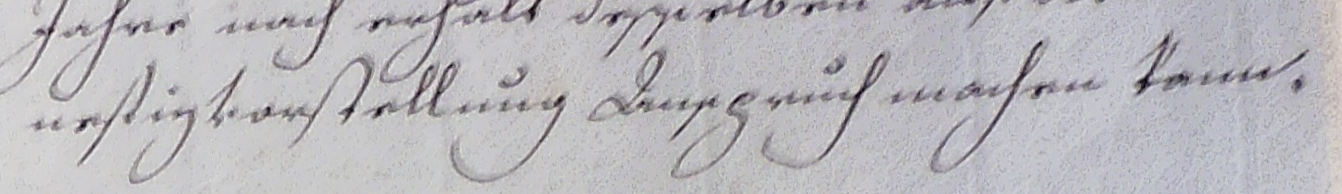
nefizvorstellung Anspruch machen kann.
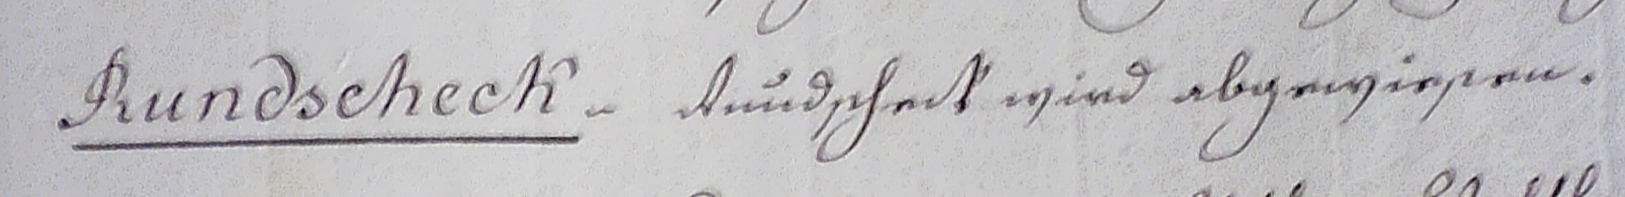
Rundscheck .. Rundscheck wird abgewiesen.
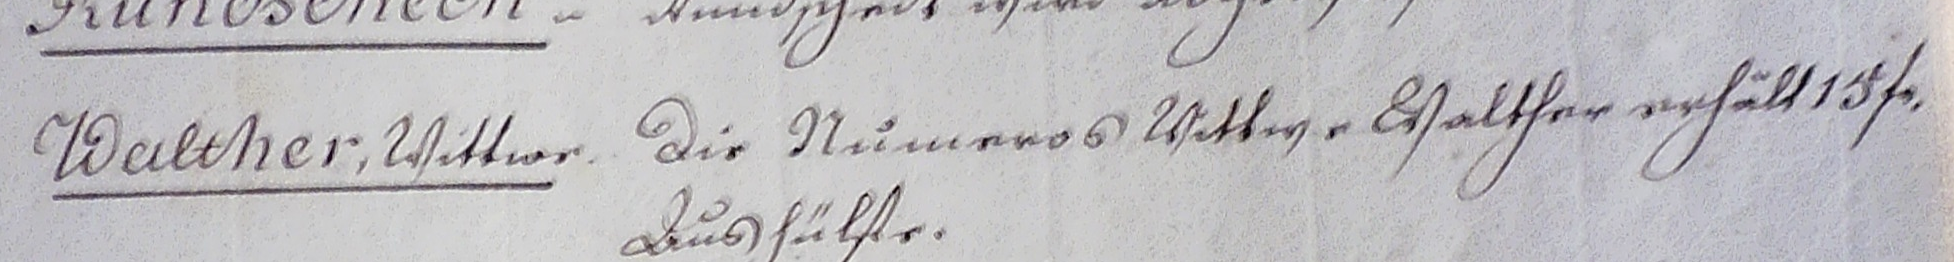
Walther, Wittwe Die Numeros Wittwe Walther erhält 15fr.
